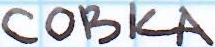совка
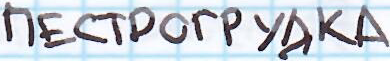пестрогрудка
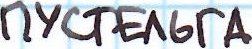пустельга
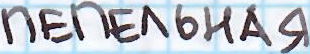пепельная
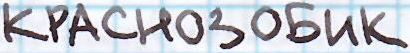краснозобик
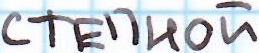степной
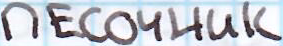песочник
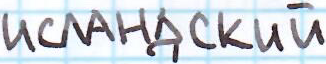исландский
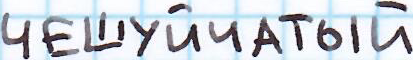чешуйчатый
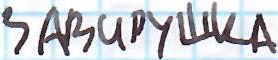завирушка
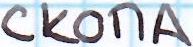скопа
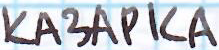казарка
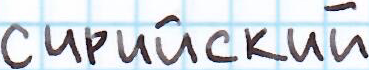сирийский
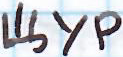щур
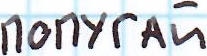попугай
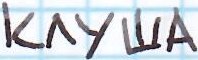клуша
